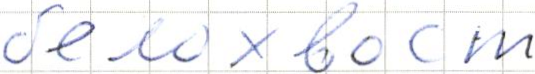белохвост
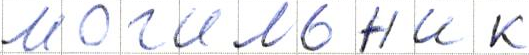могильник
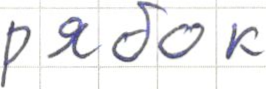рябок
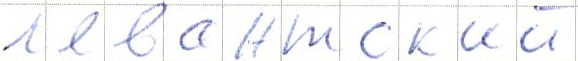левантский
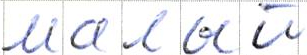малый
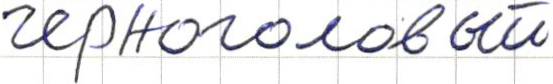черноголовый
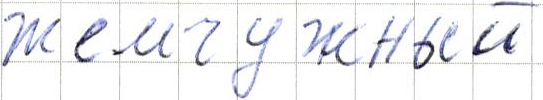жемчужный
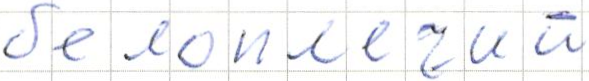белоплечий
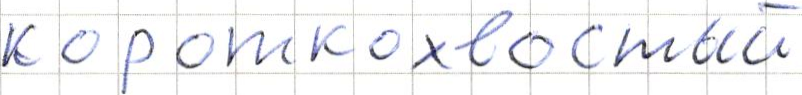короткохвостый
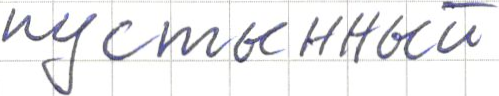пустынный
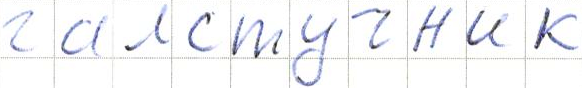галстучник
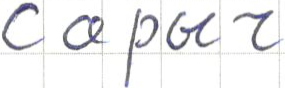сарыч
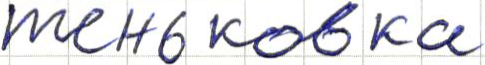теньковка
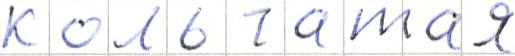кольчатая
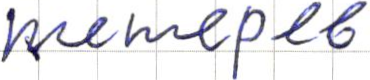тетерев
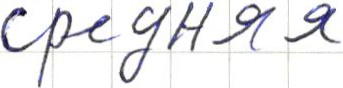средняя
